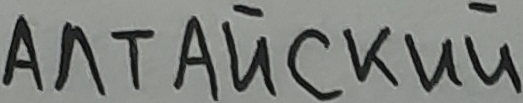алтайский
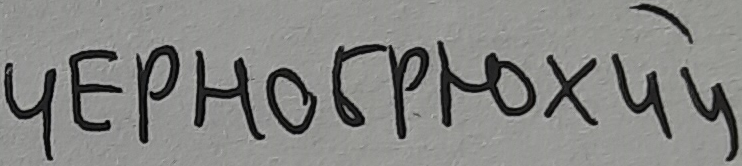чернобрюхий
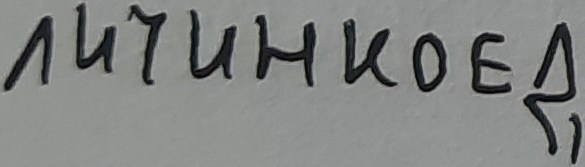личинкоед
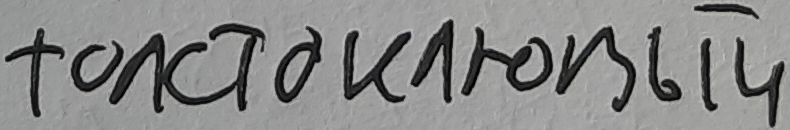толстоклювый
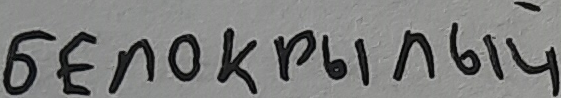белокрылый
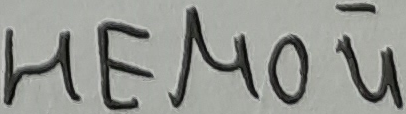немой
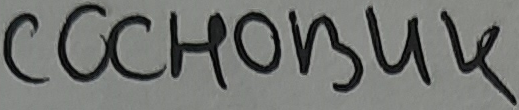сосновик
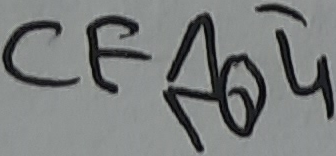седой
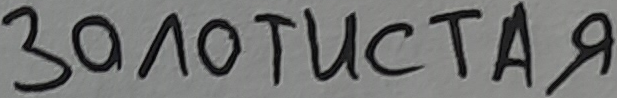золотистая
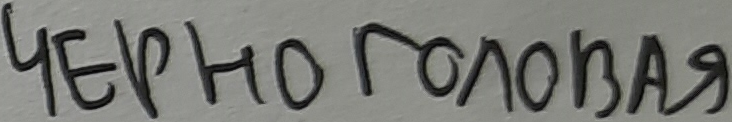черноголовая
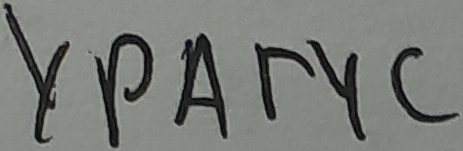урагус
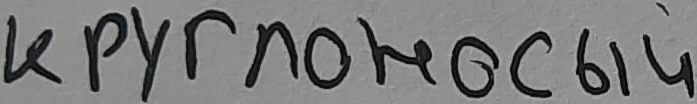круглоносый
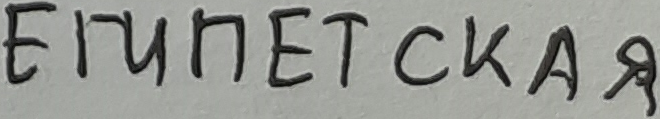египетская
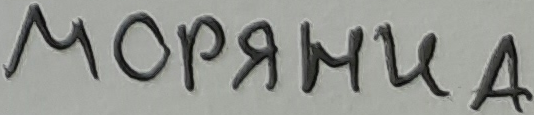морянка
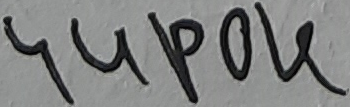чирок
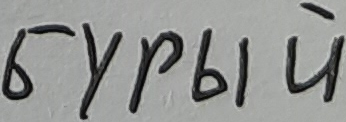бурый
